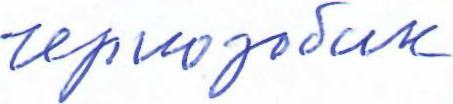чернозобик
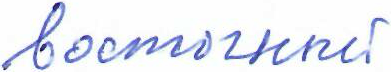восточный
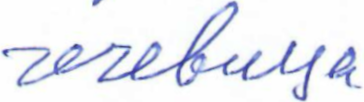чечевица
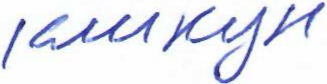кликун
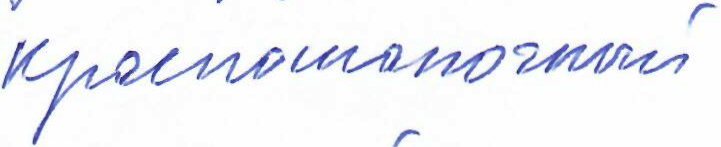красношапочный
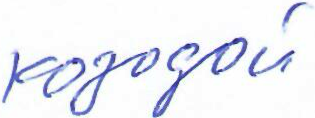козодой
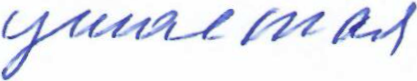ушастая
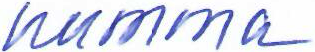питта
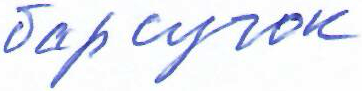барсучок
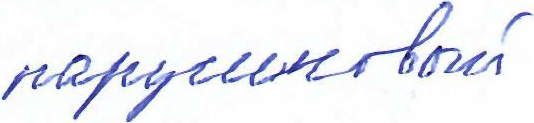парусиновый
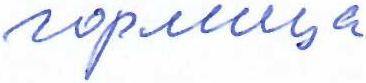горлица
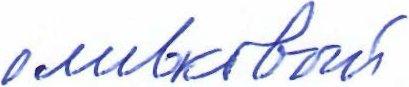оливковый
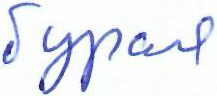бурая
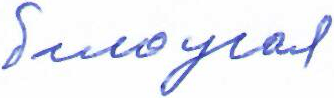белоусая
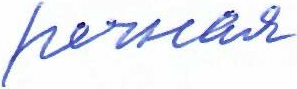речная
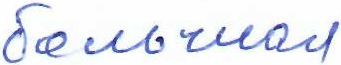большая
